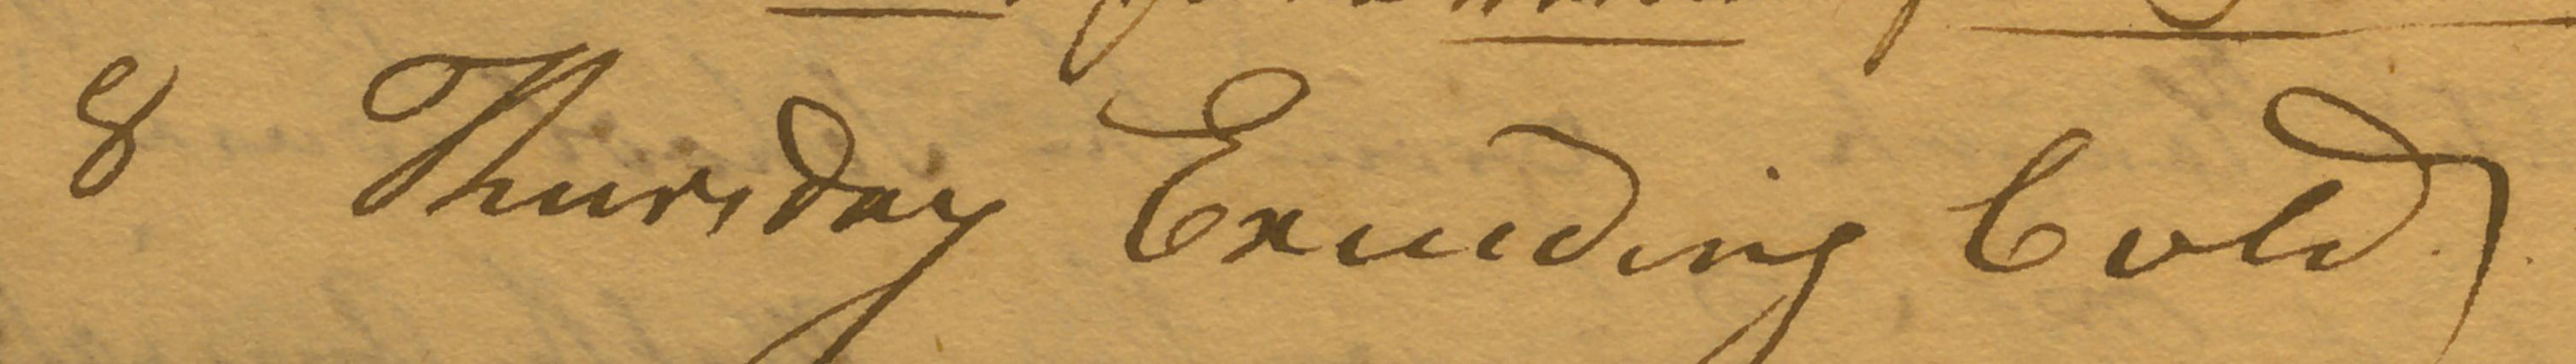8 Thursday Exceeding Cold
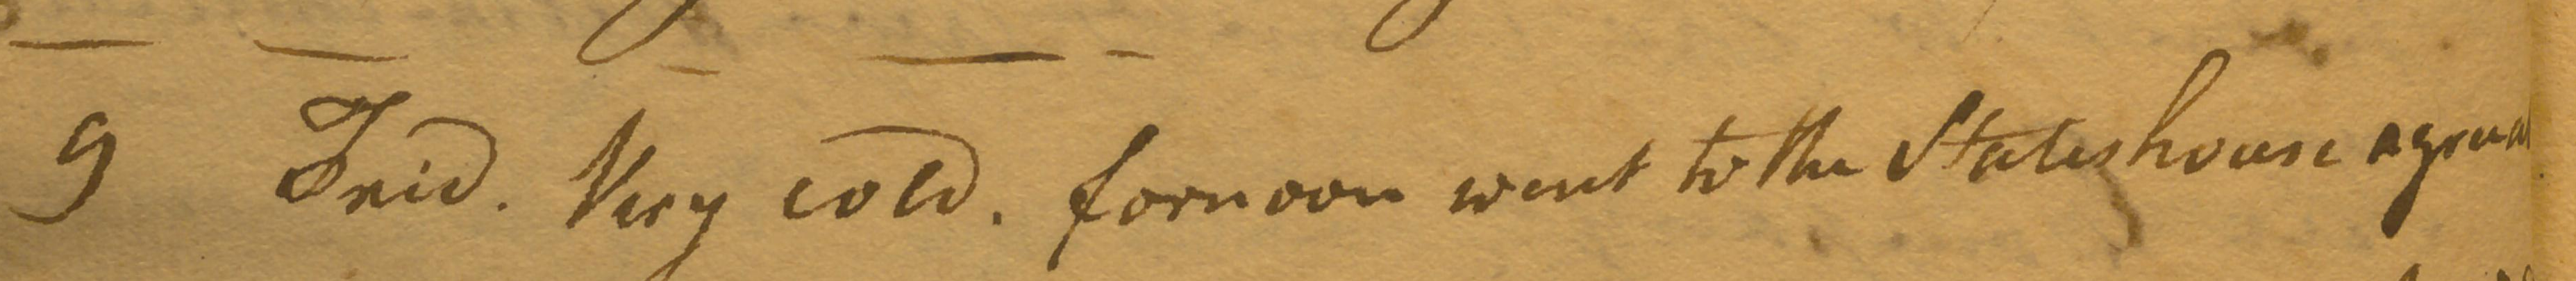9 Frid. Very cold. fornoon went to the Stateshouse agree
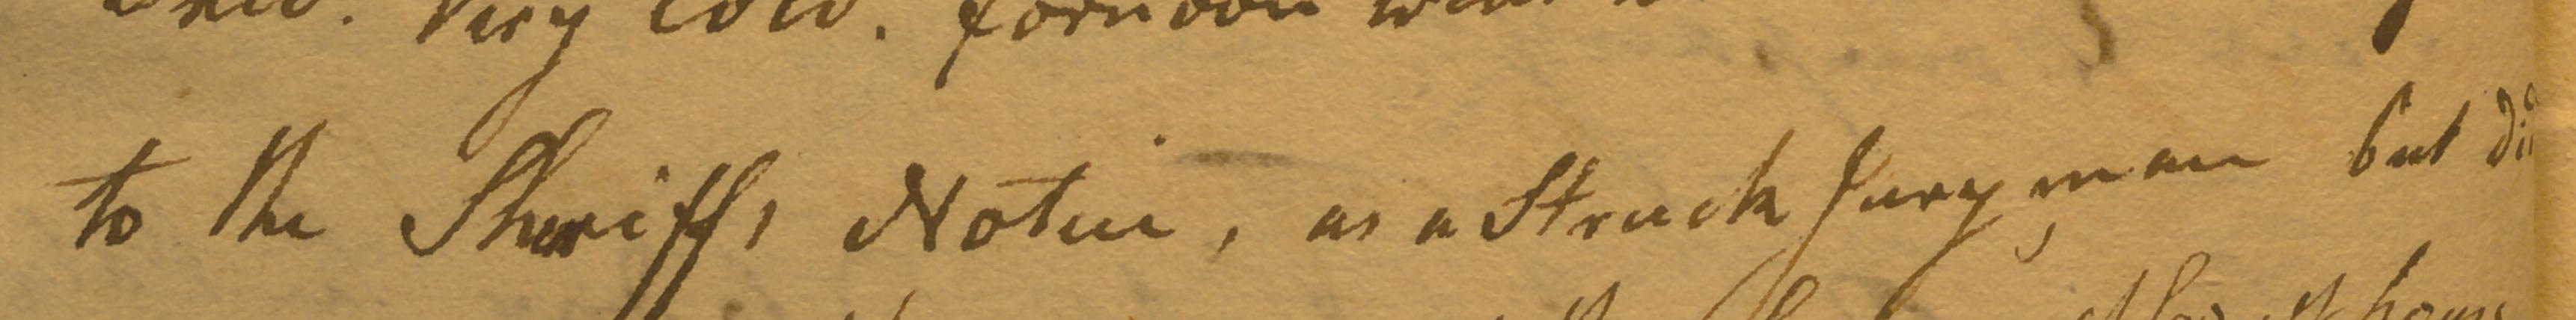to the Sheriffs Notice, as a Struck Jury man but did
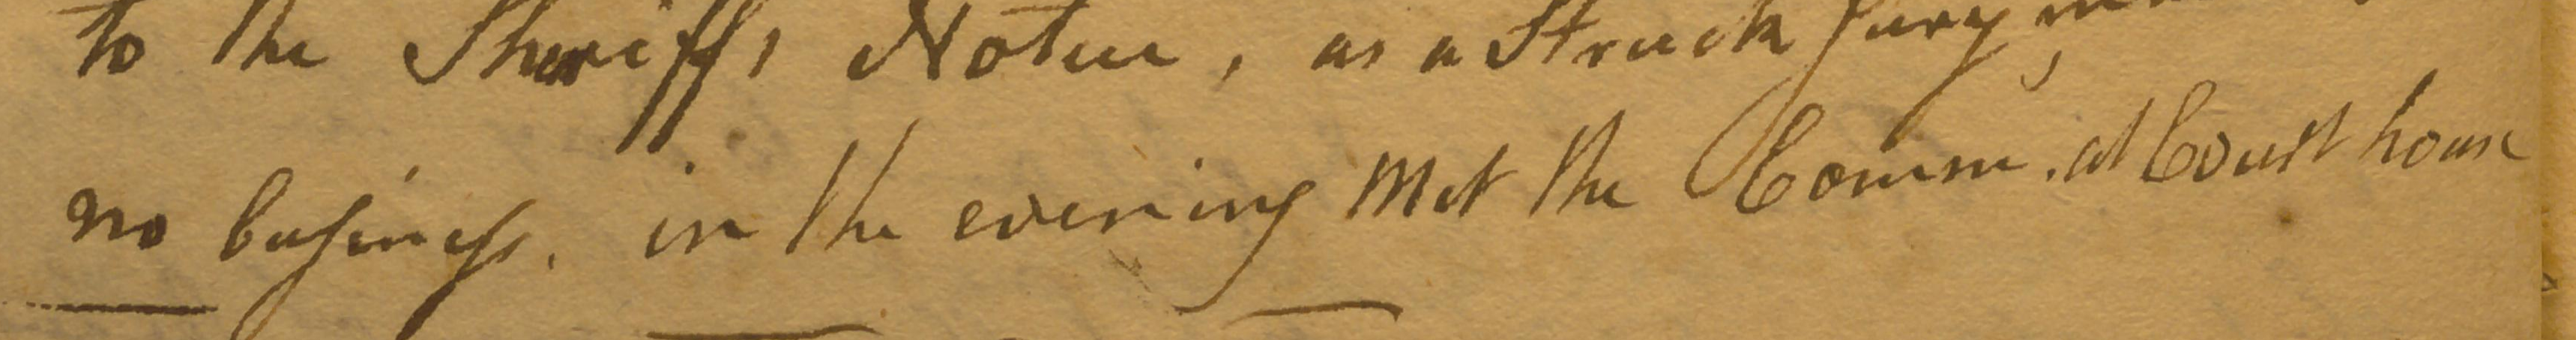no business. in the evening Met the Comm. at Court house
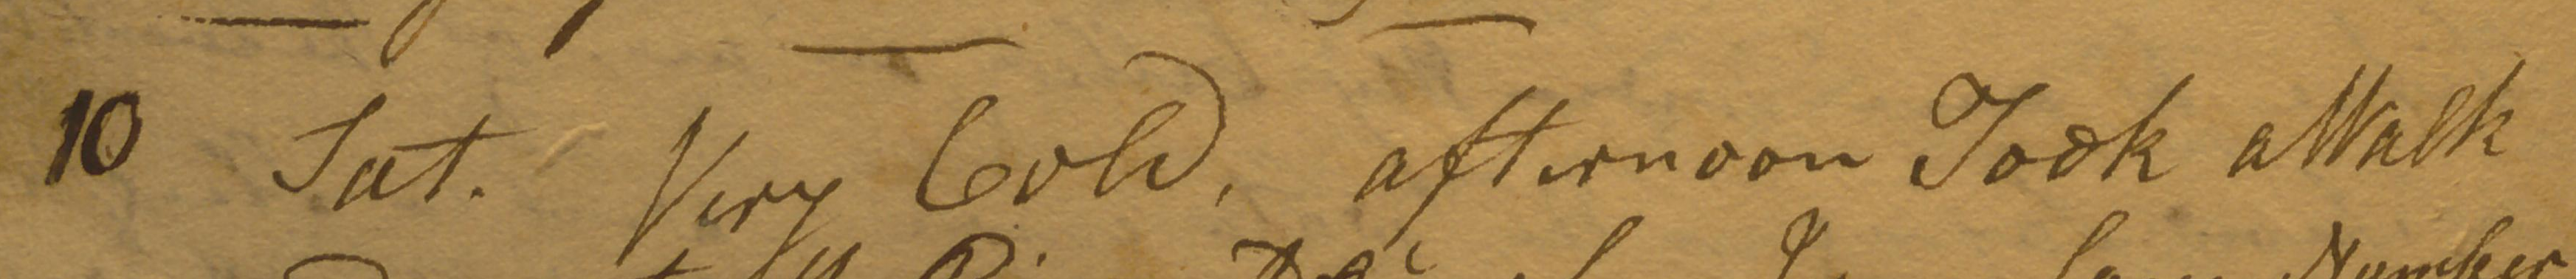10 Sat. Very Cold. afternoon Took a Walk
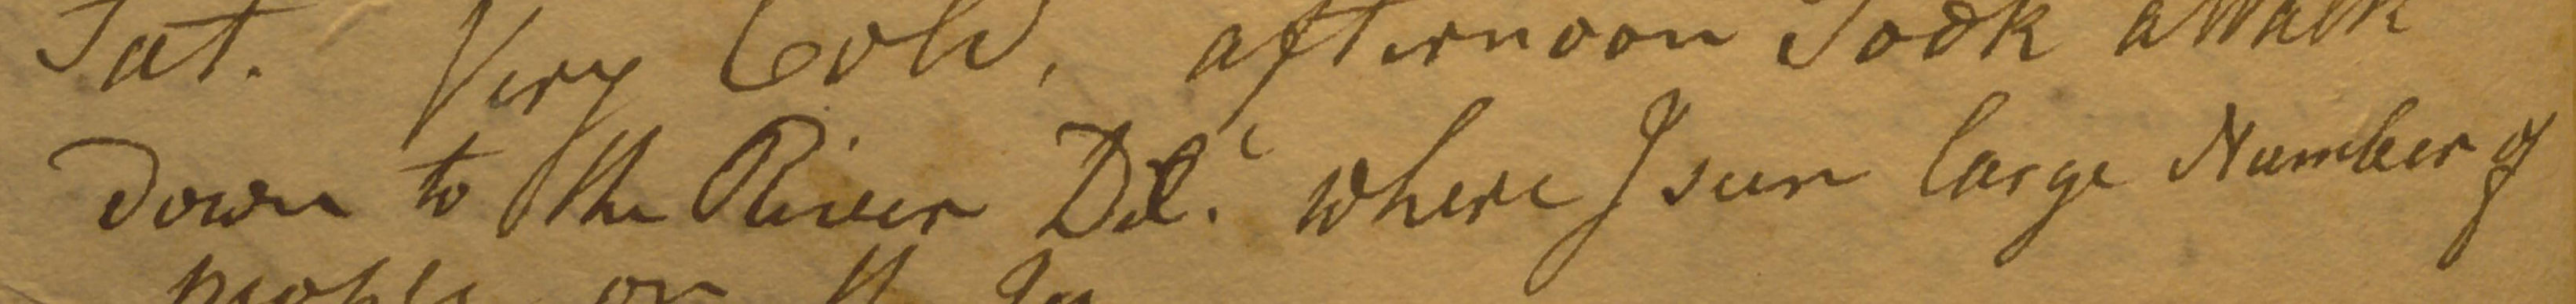down to the River Del^e. where I seen large Number of
